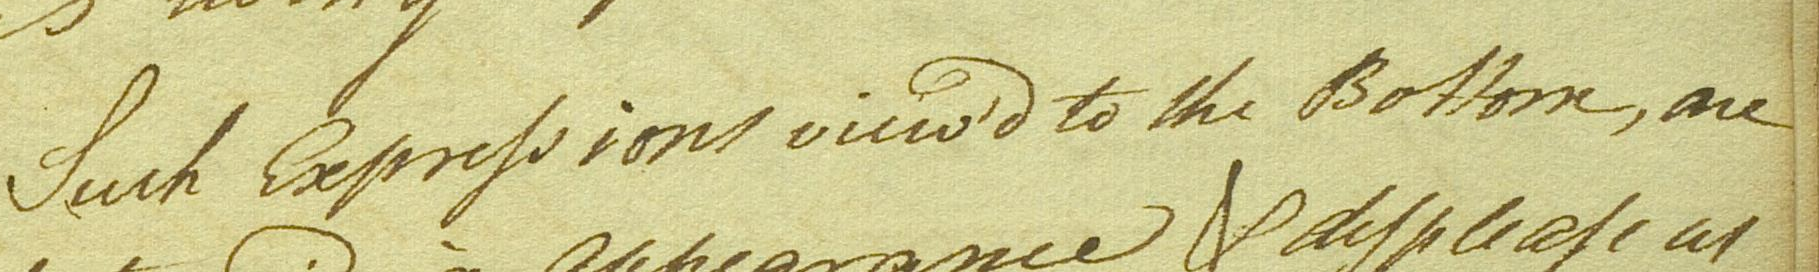Such Expressions view'd to the Bottom, are
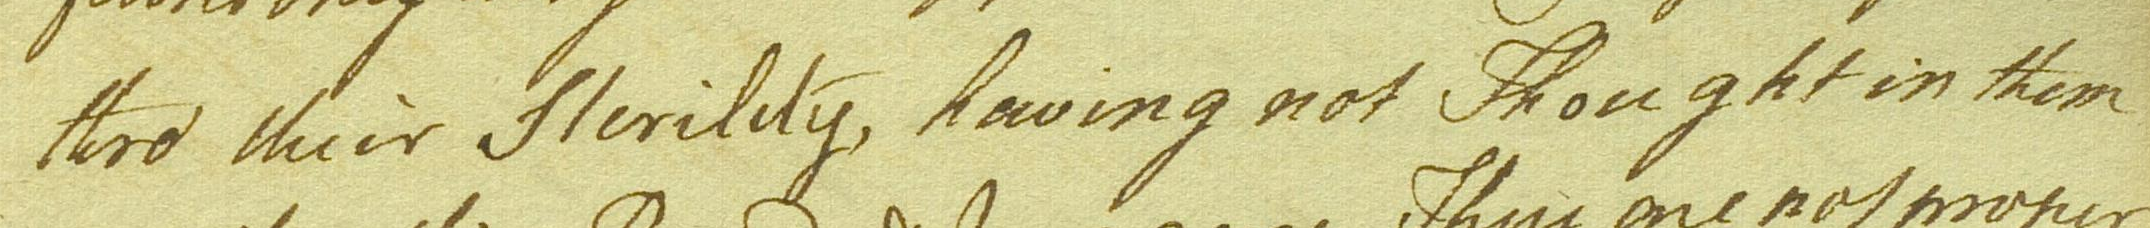thro' their Sterility, having not Thought in them
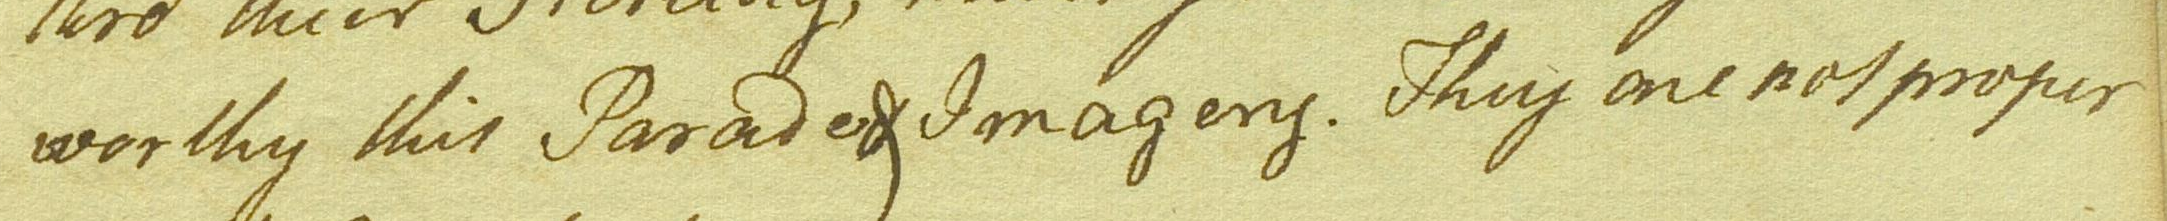worthy this Parade & Imagery. They are not proper
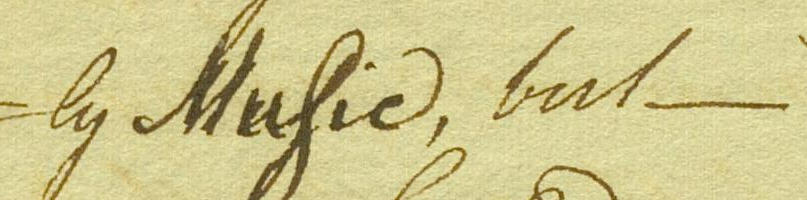-ly Music, but-
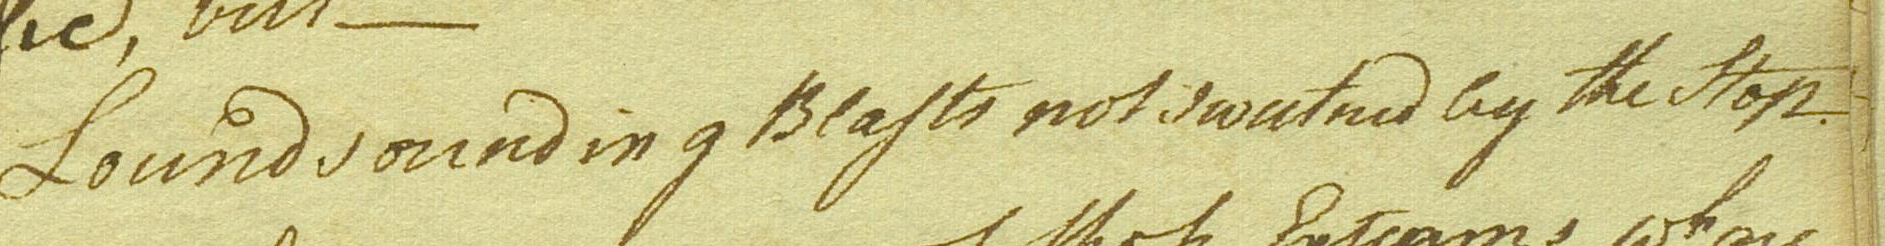Lound sounding Blasts not sweetened by the Stop.
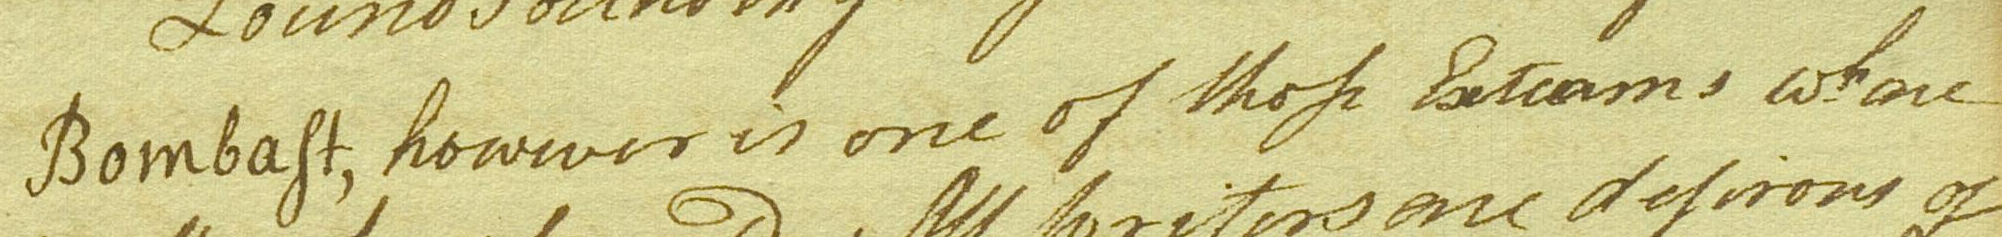Bombast, however is one of those Extreams w^h are
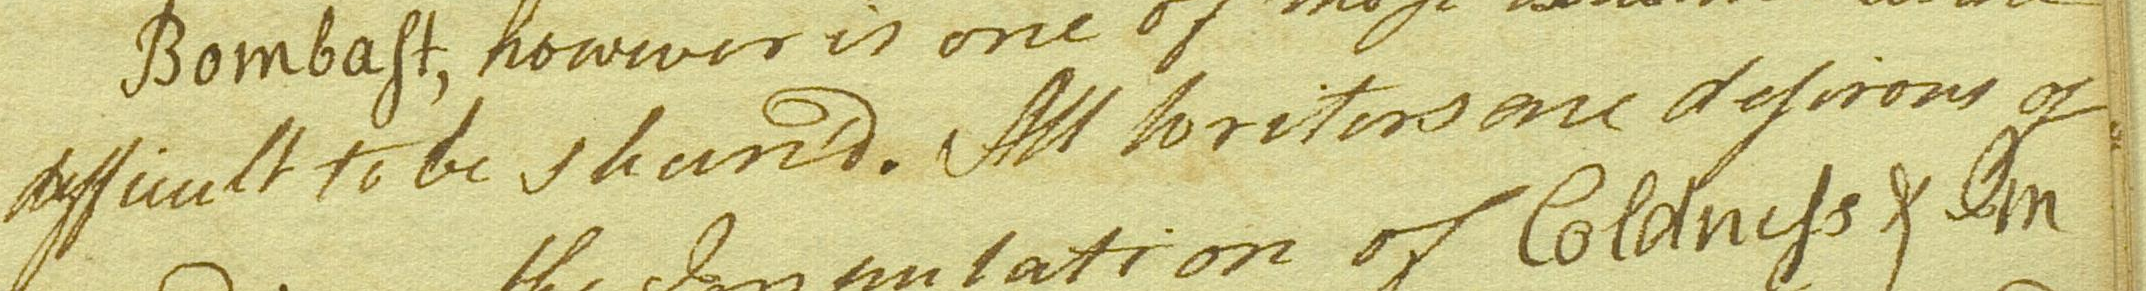difficult to be shar'd. All writers are desirous of
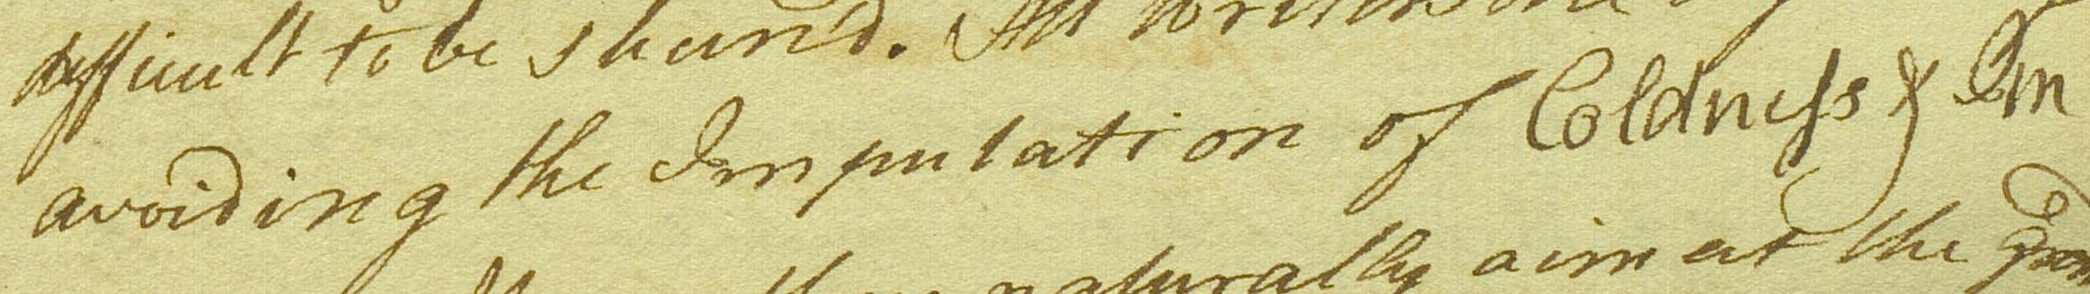avoiding the Imputation of Coldness & Im
